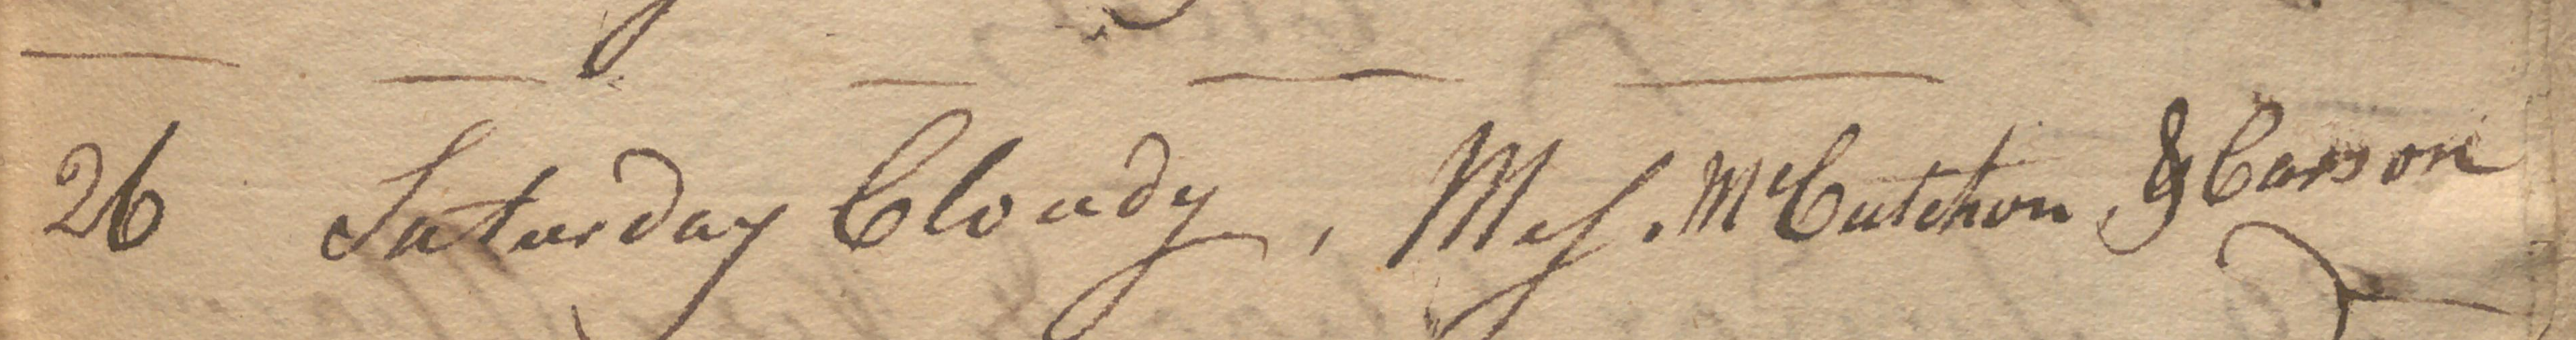26 Saturday Cloudy, Mes. M^cCutchon & Carson
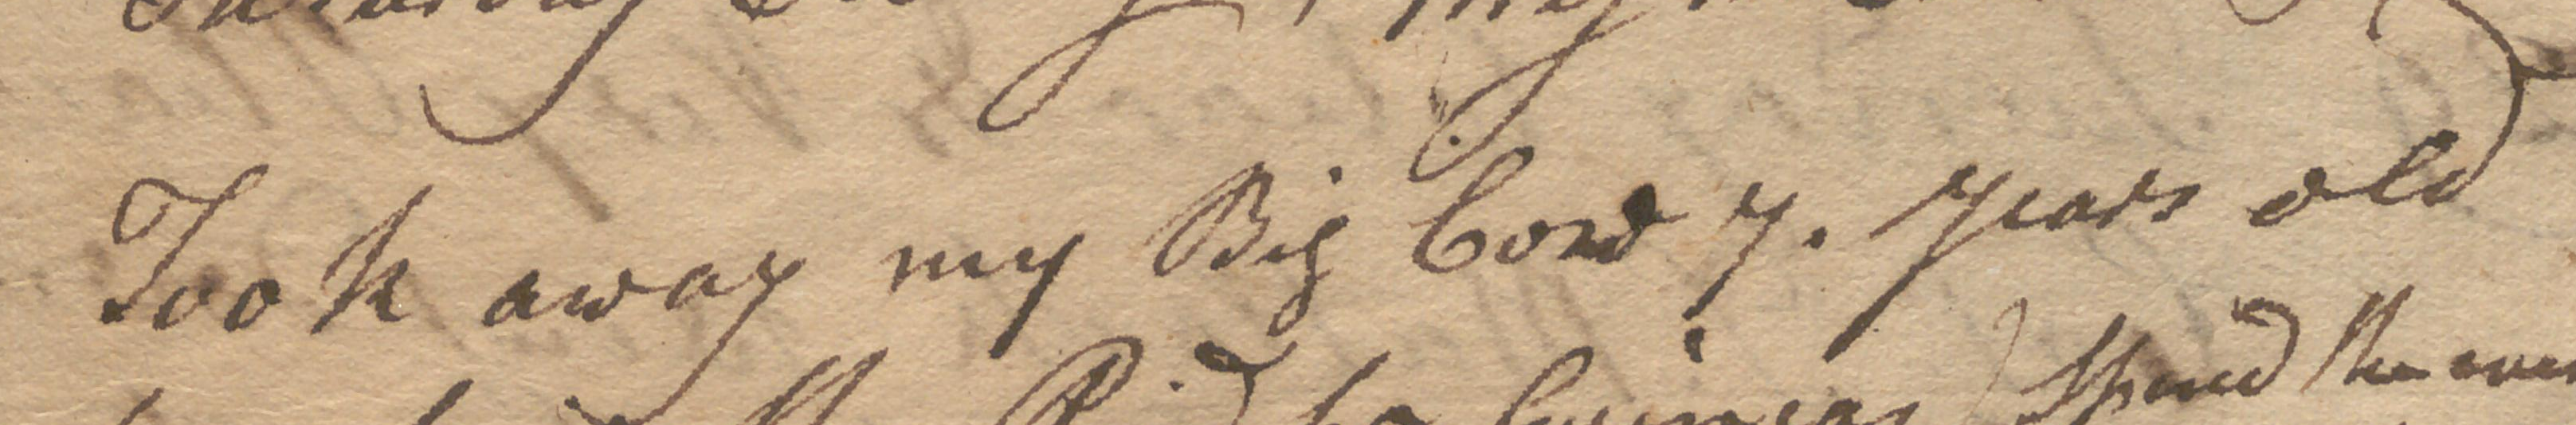Took away my Big Cow 7. years old
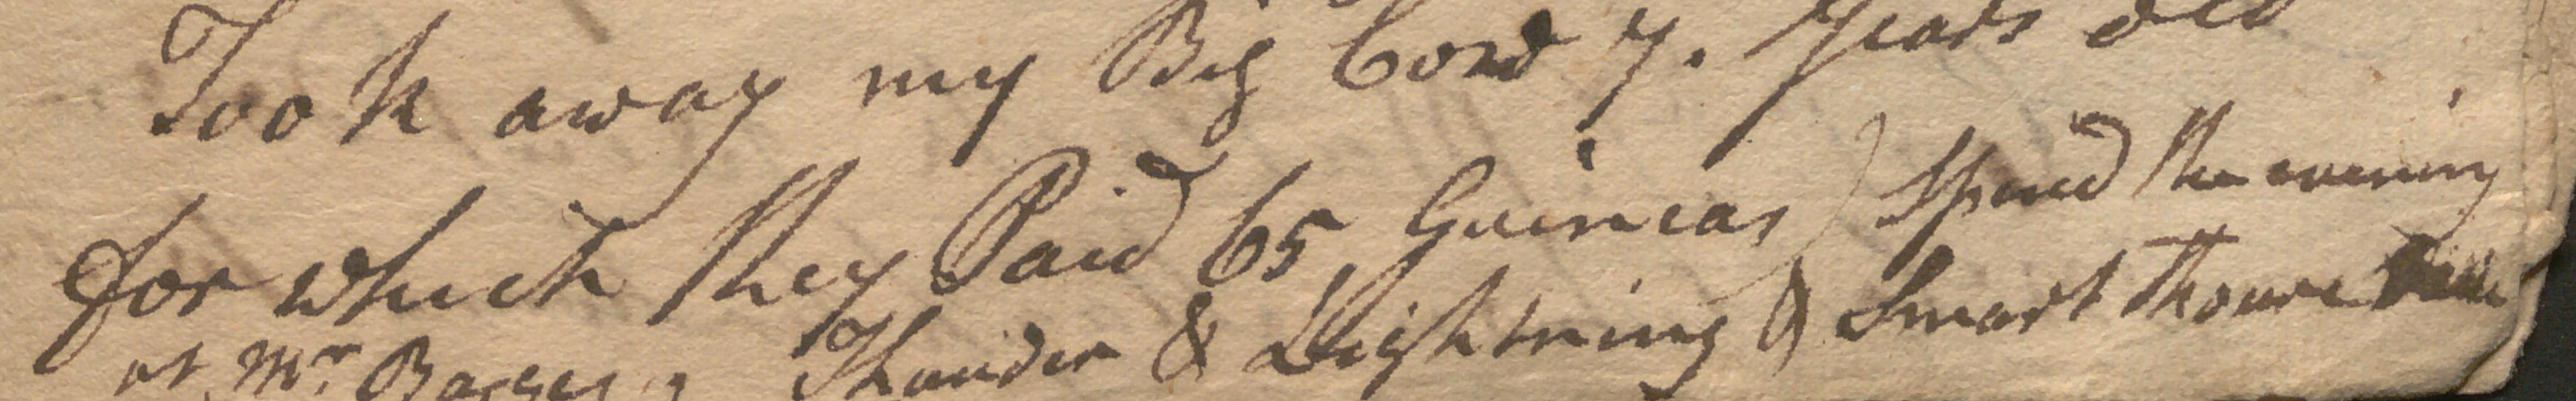for which they Paid 6 Guineas spend the evening
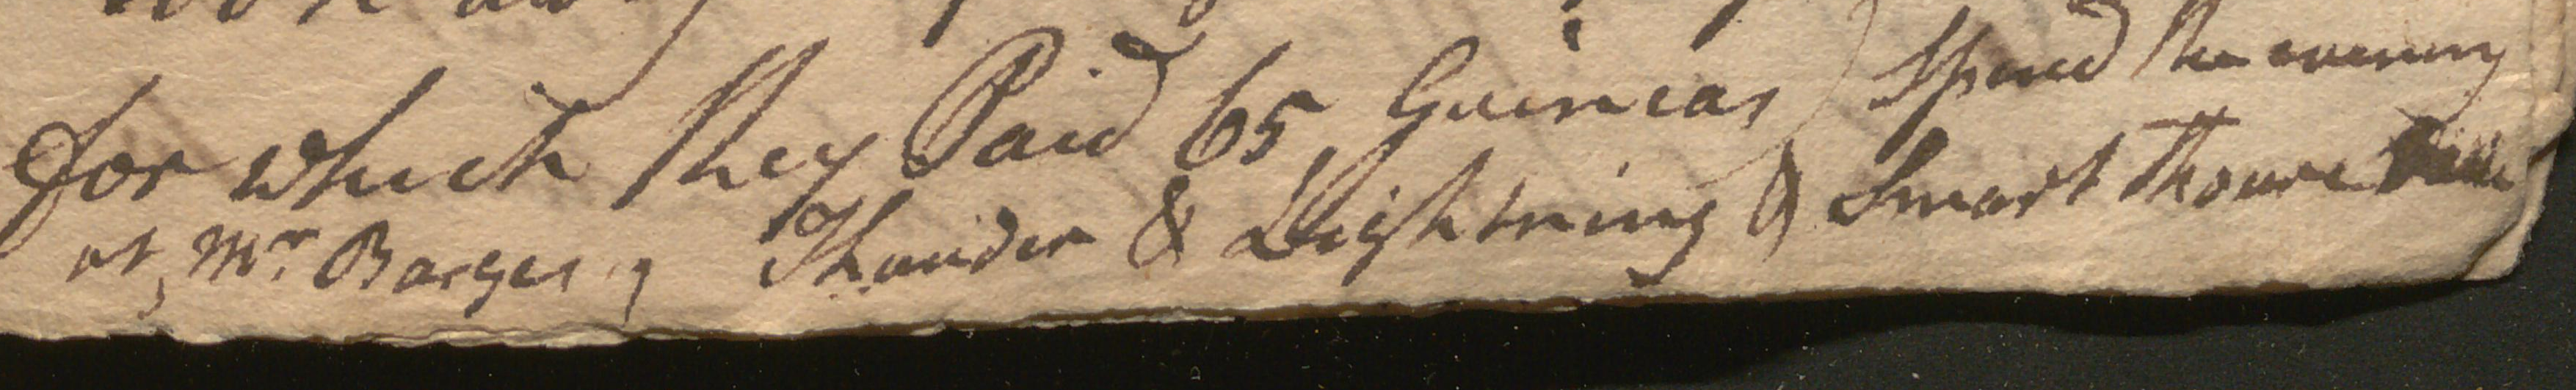at M^r. Barges, Thunder & Lightning & smart shoure [____]
